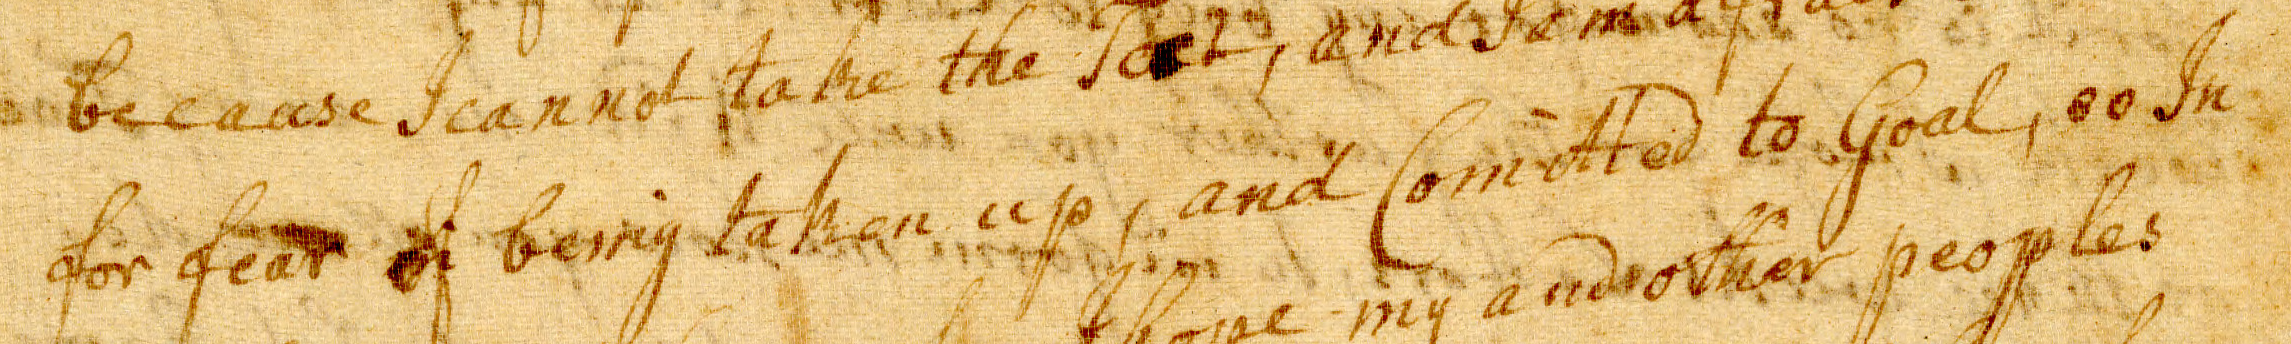for fear of being taken up and Comitted to Goal, so In
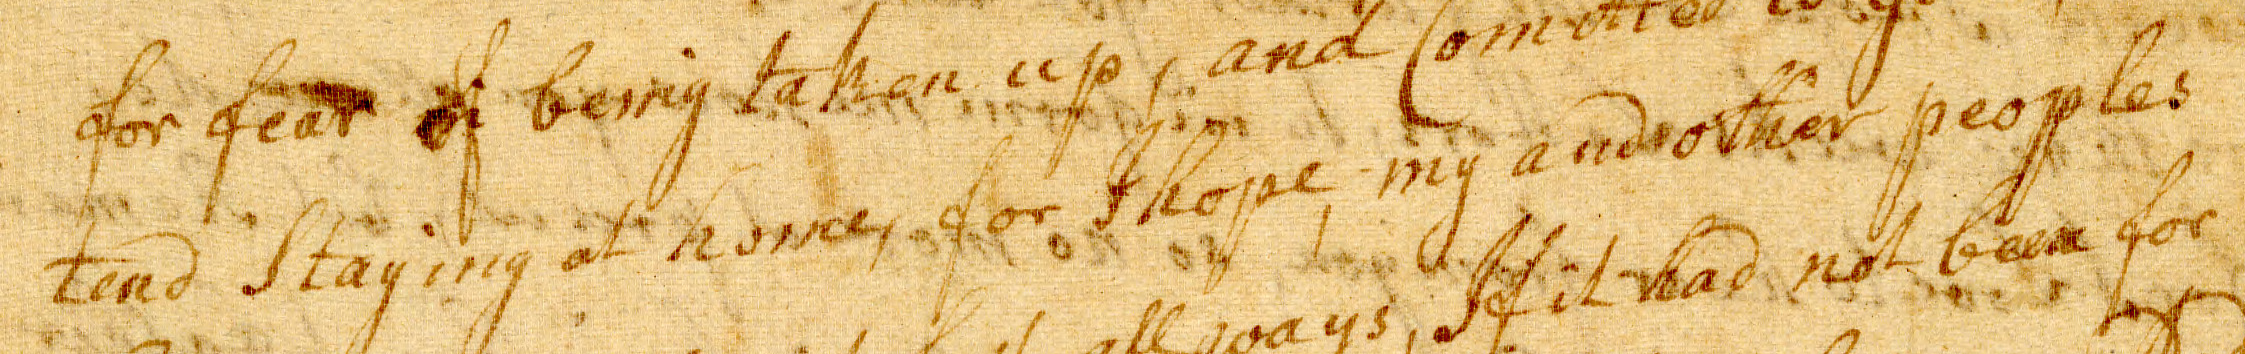tend Staying at home, for I hope my and other peoples
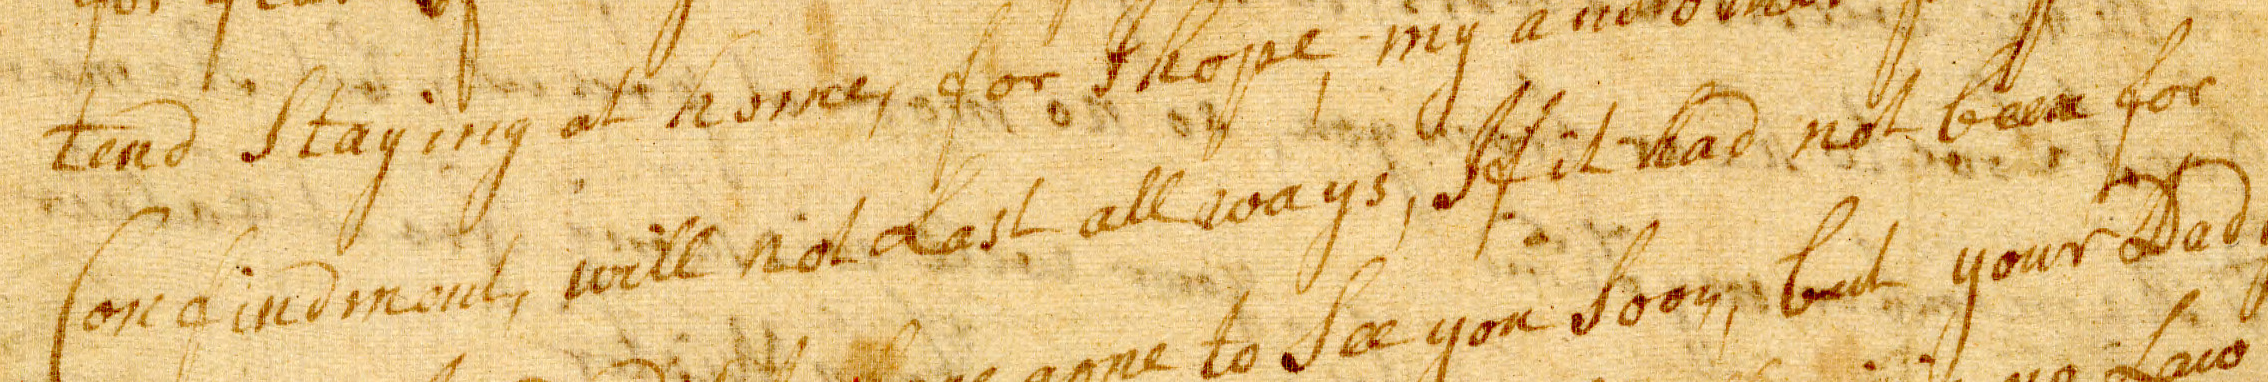Confindment will not Last allways, If it had not been for
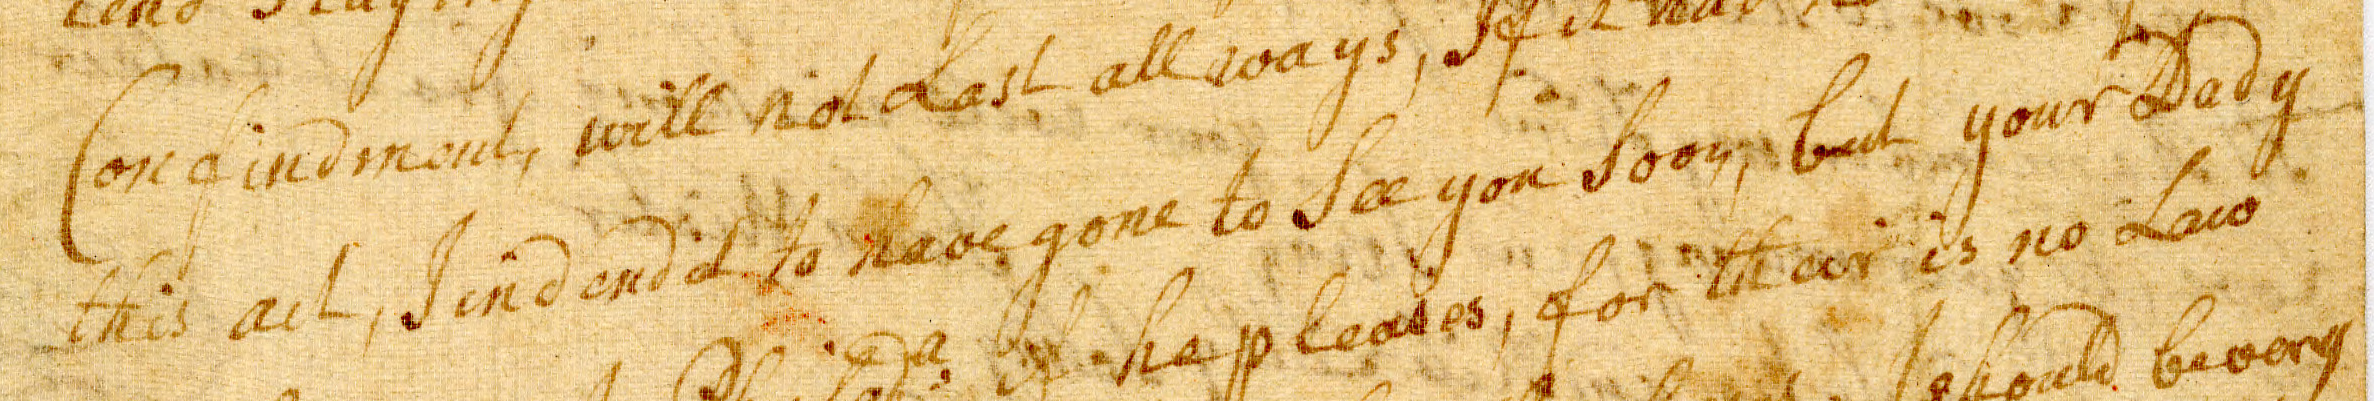this act, I indended to have gone to See you Soon, but your Dady
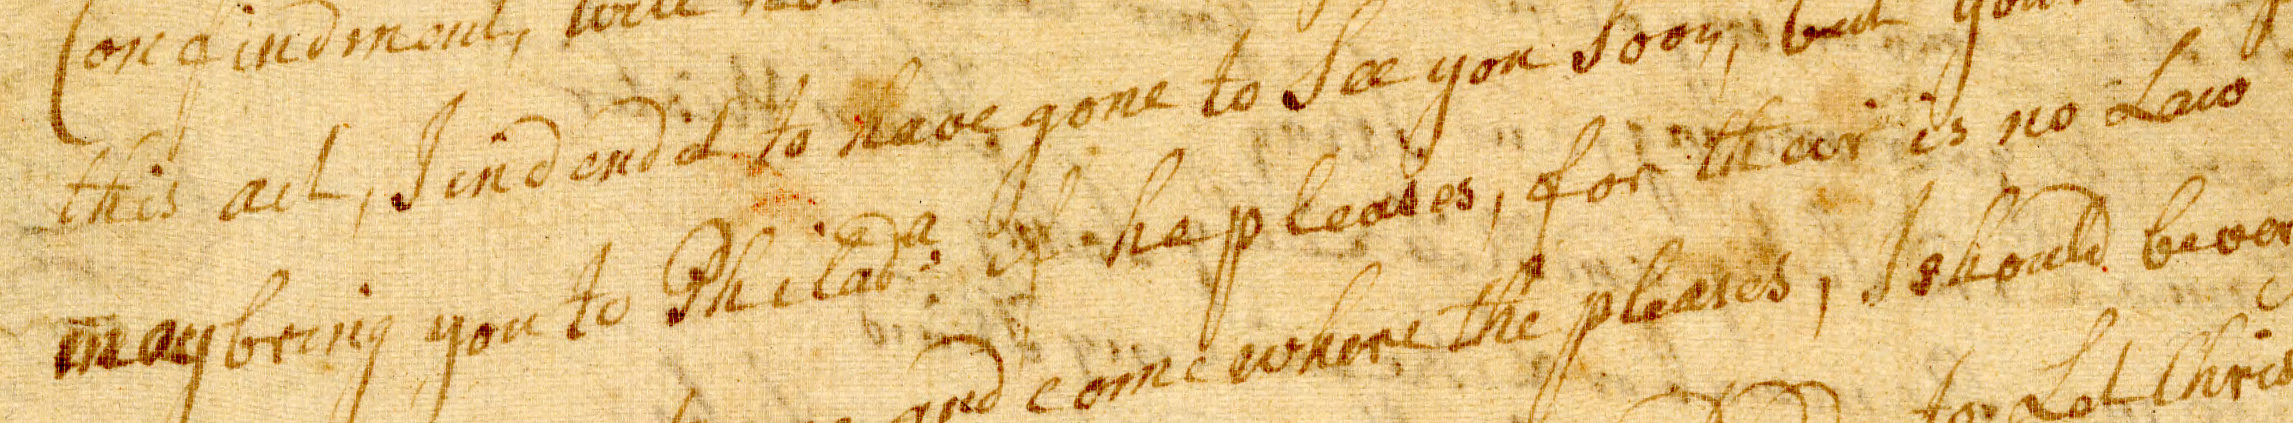may bring you to Philad^a if he pleases, for their is no Law
